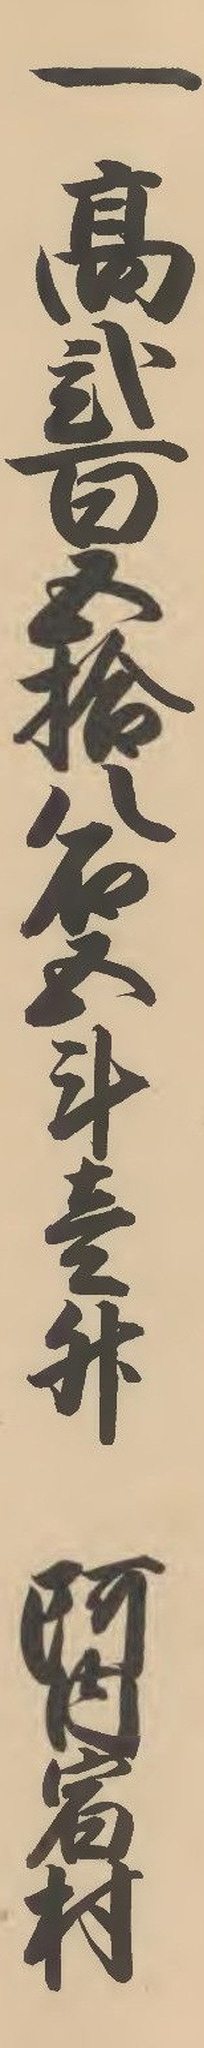一髙弐百五拾八石五斗壱升阿内宿村
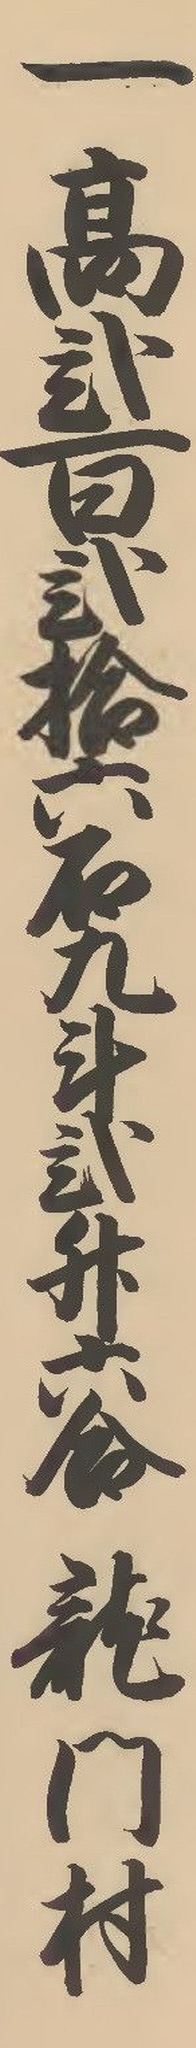一髙弐百弐拾六石九斗弐升六合龍門村
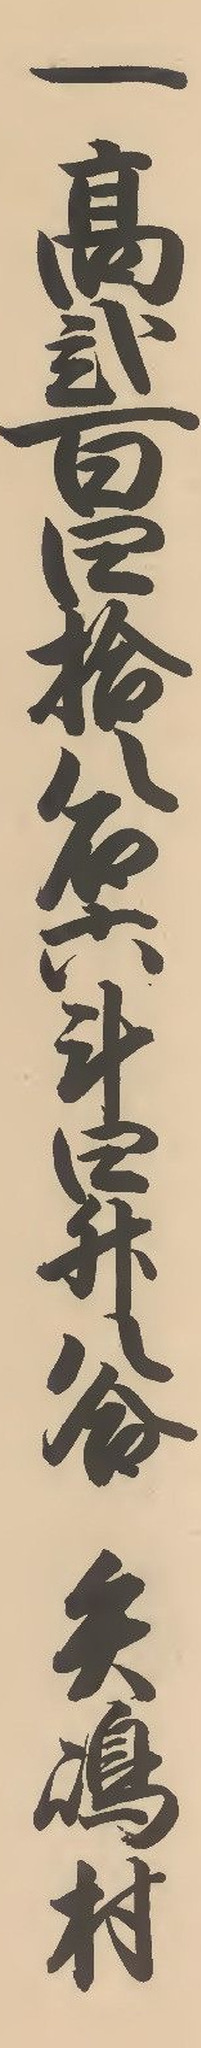一髙弐百四拾八石六斗四升八合矢嶋村
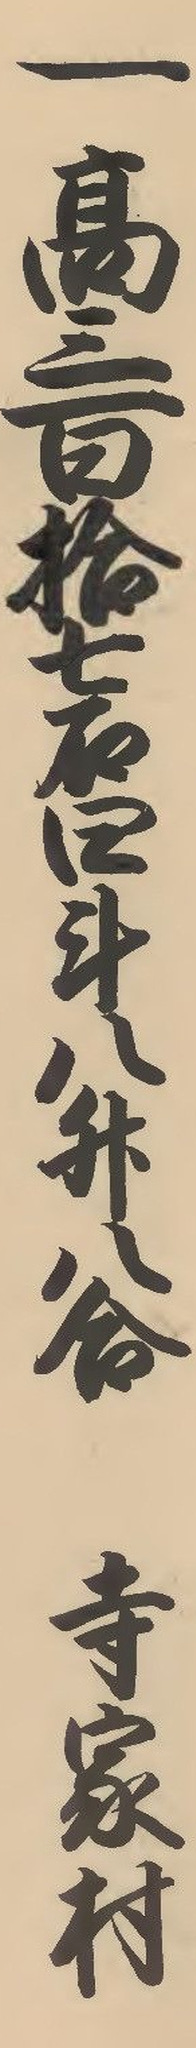一髙三百拾七石四斗八升八合寺家村
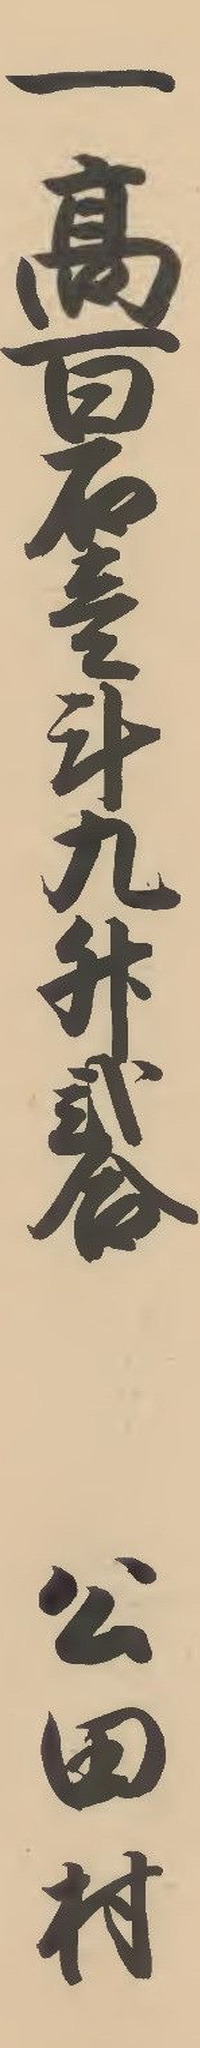一髙百石壱斗九升弐合公田村
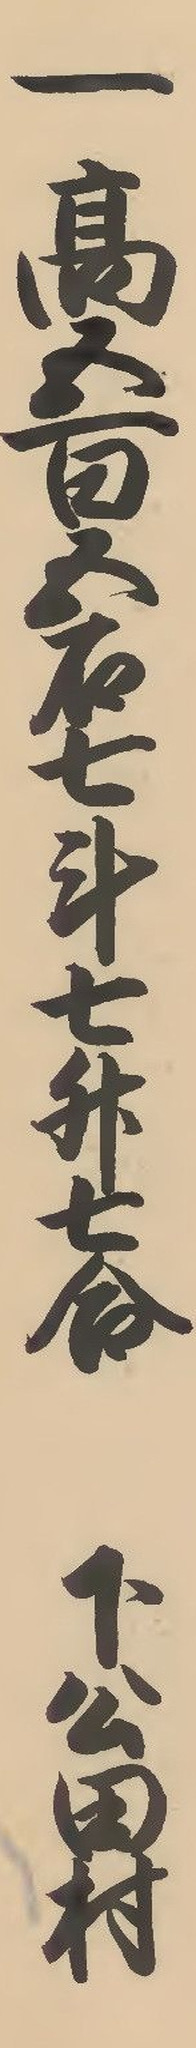一髙五百五石七斗七升七合下公田村

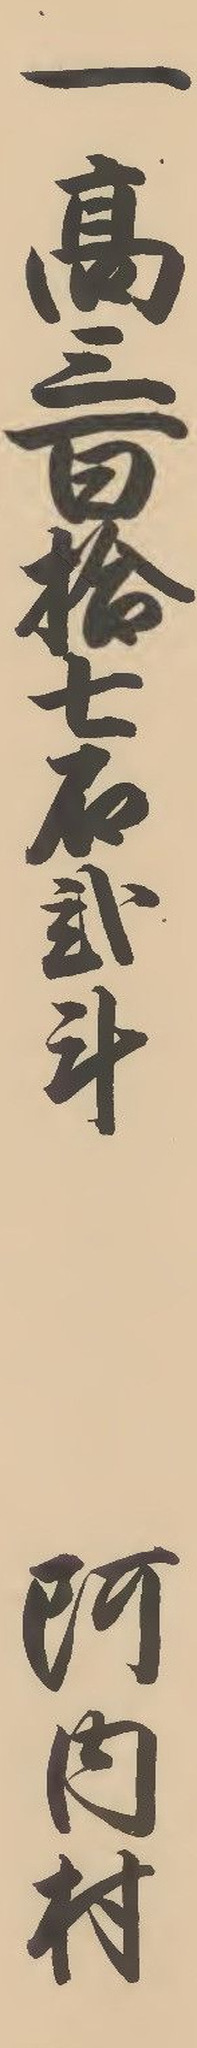一髙三百拾七石弐斗阿内村
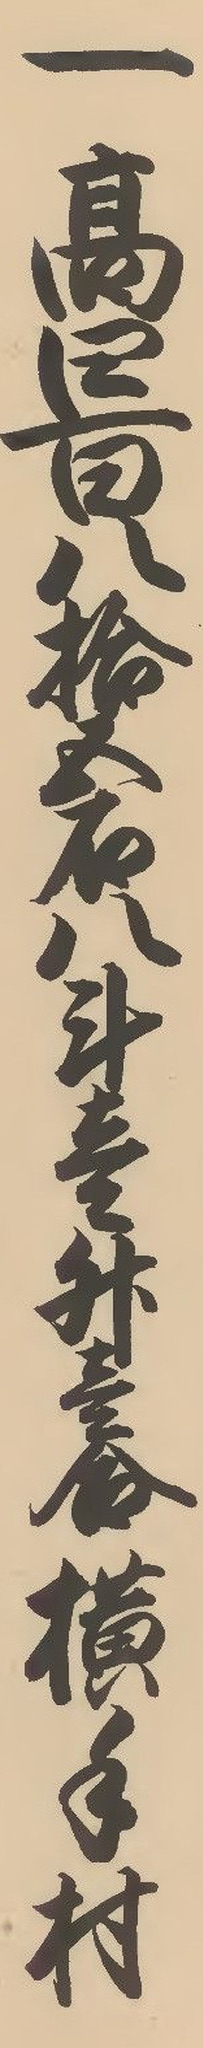一髙四百八拾五石八斗壱升壱横手村
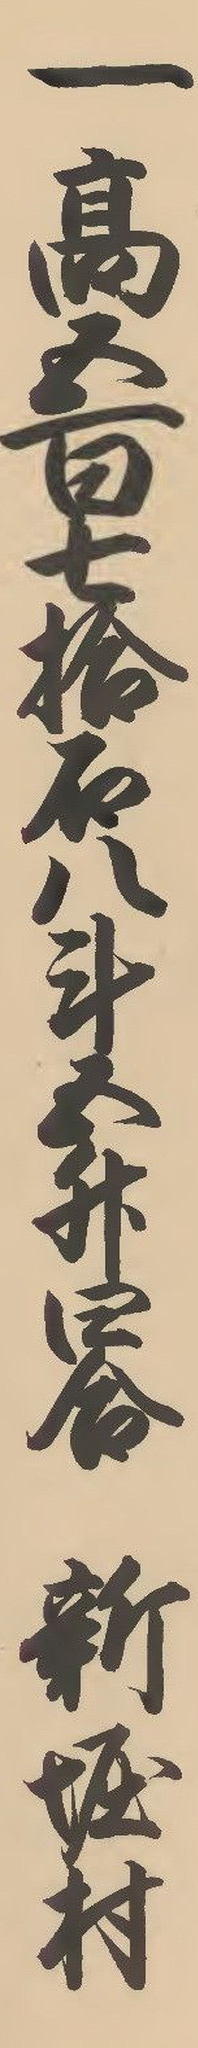一髙五百七拾石八斗五升四合新堀村
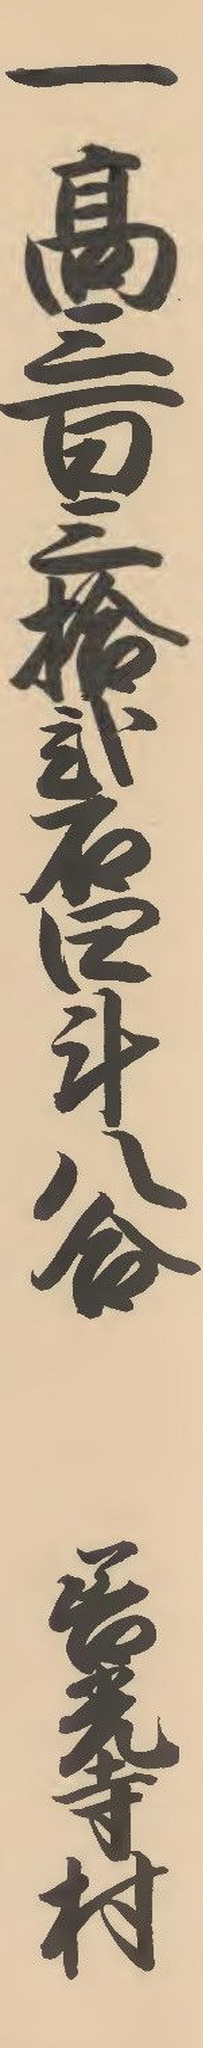一髙三百三拾弐石四斗八合善光寺村
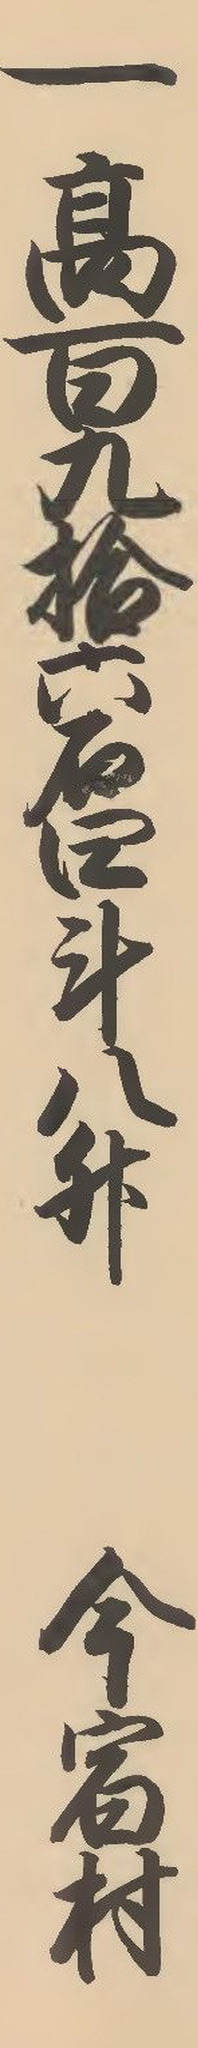一髙百九拾六石四斗八升今宿村
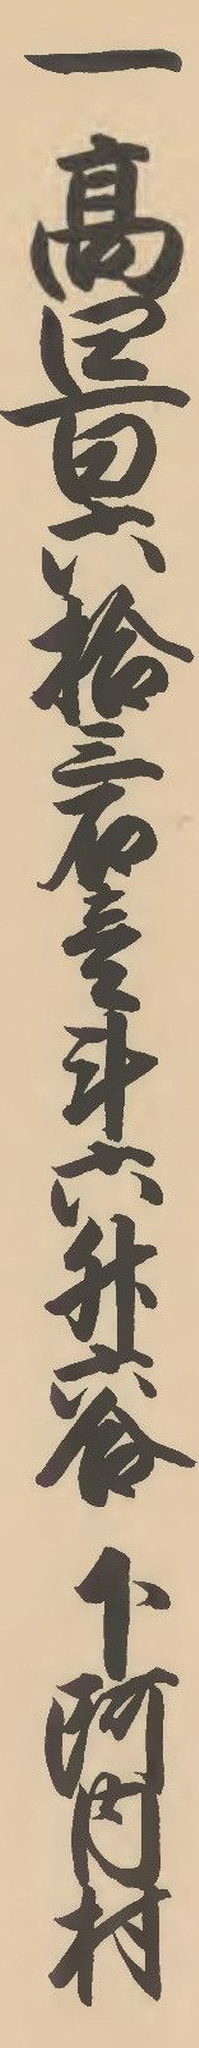一髙四百六拾三石壱斗六升六合下阿内村
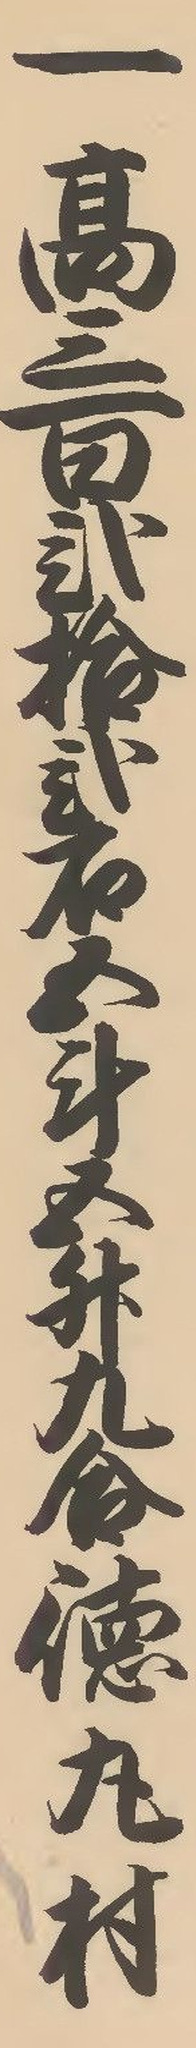一髙三百弐拾弐石五斗五升九合徳丸村

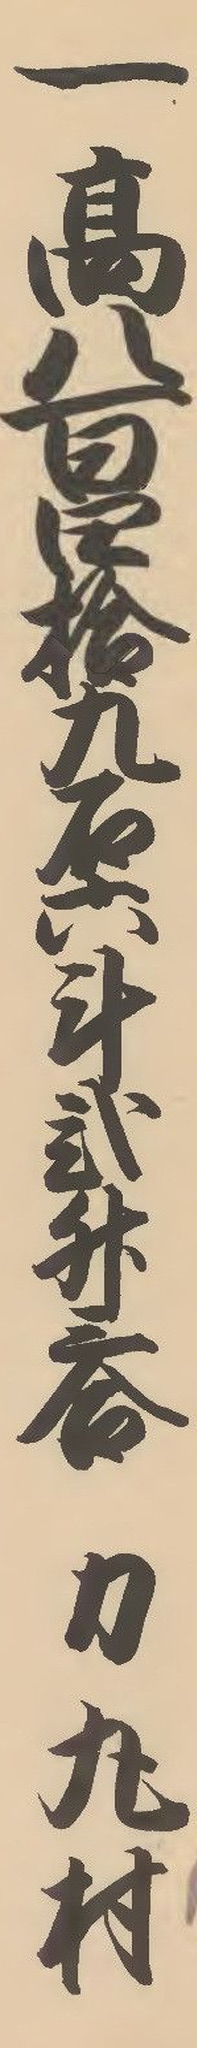一髙八百四拾九石六斗弐升三合力丸村
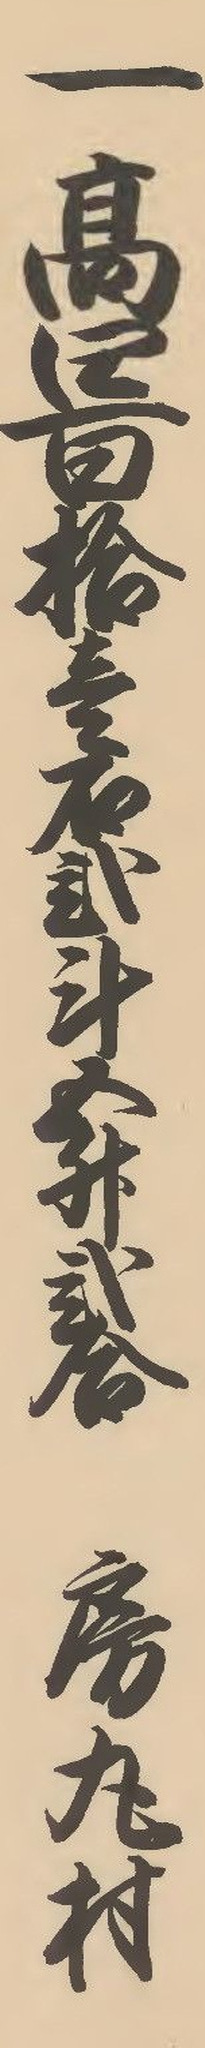一髙四百拾壱石弐斗五升弐合房丸村
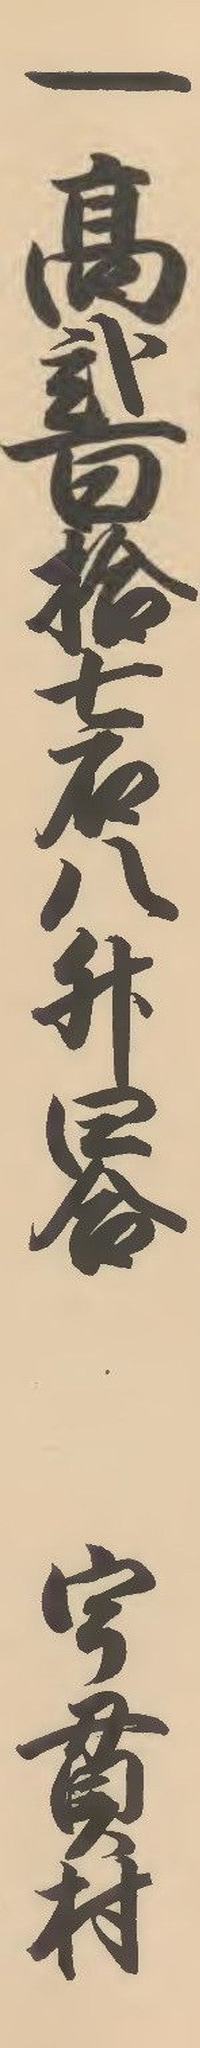一髙弐百拾七石八升四合宇貫村
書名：上野国郷帳
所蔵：国立公文書館 National Archives of Japan
